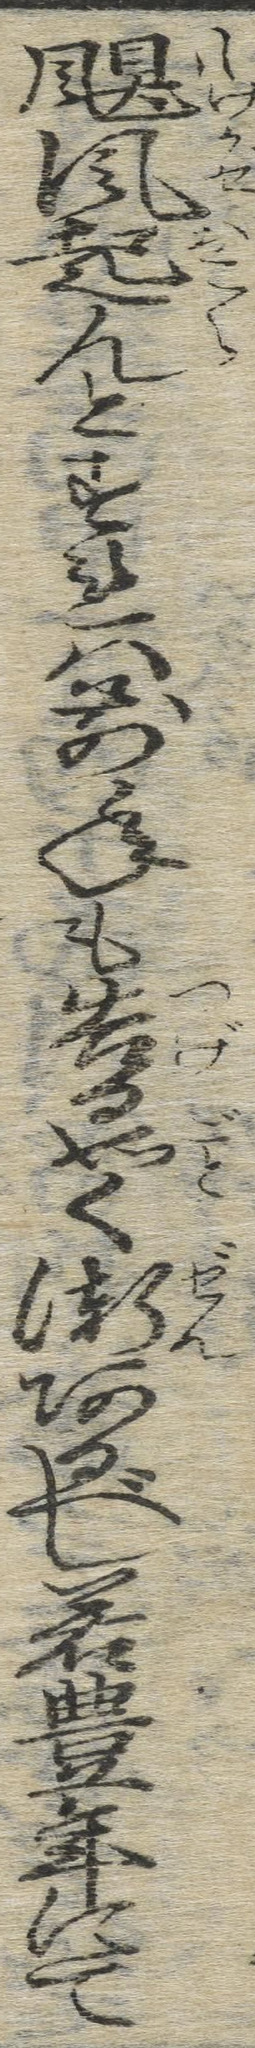颶風起んとすれは前年も告る如く漸あるべし若豊年にて
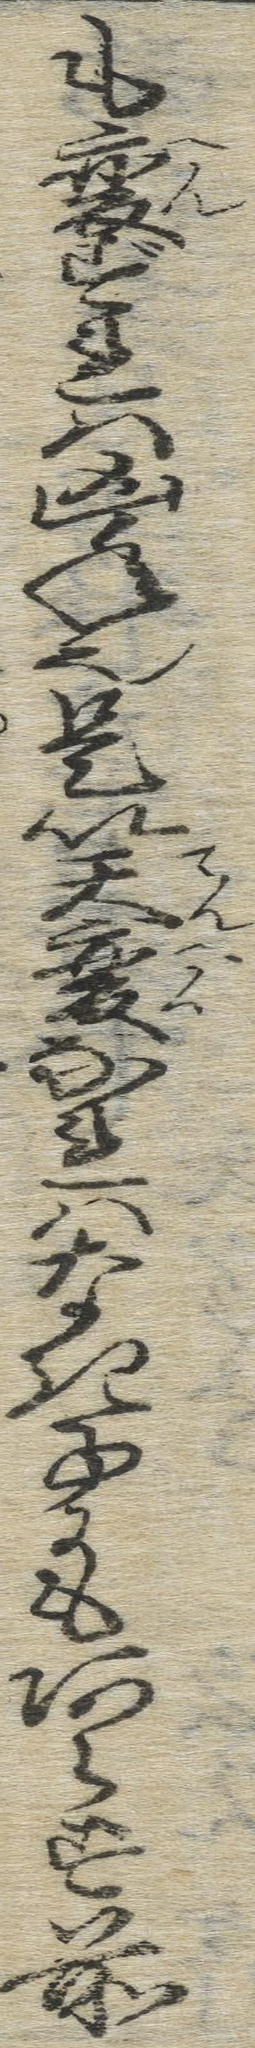も変ずれは凶年也是以天変なれはなき事にもあらず前
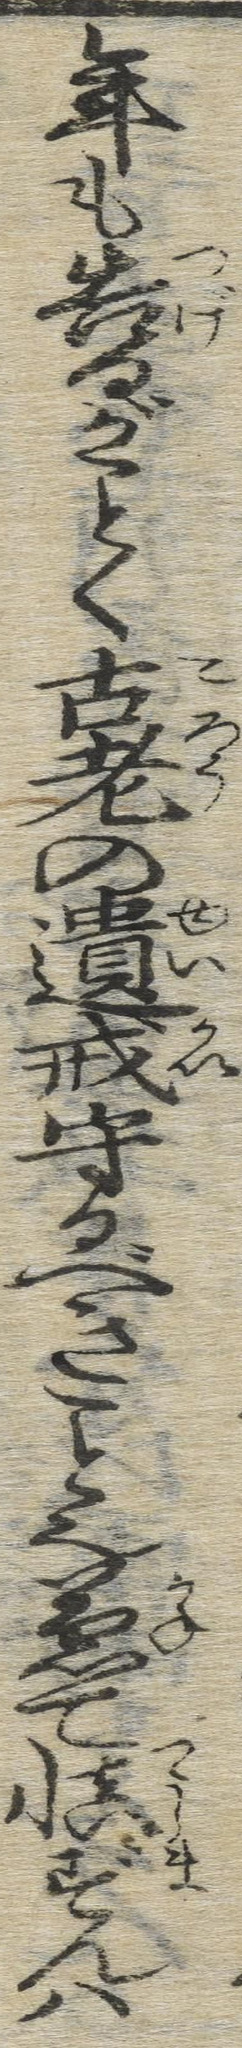年も告るごとく古老の遺戒守るべきこと也兼て慎ずんは
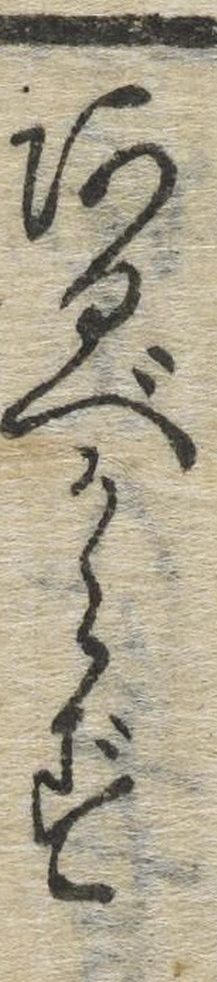あるべからず
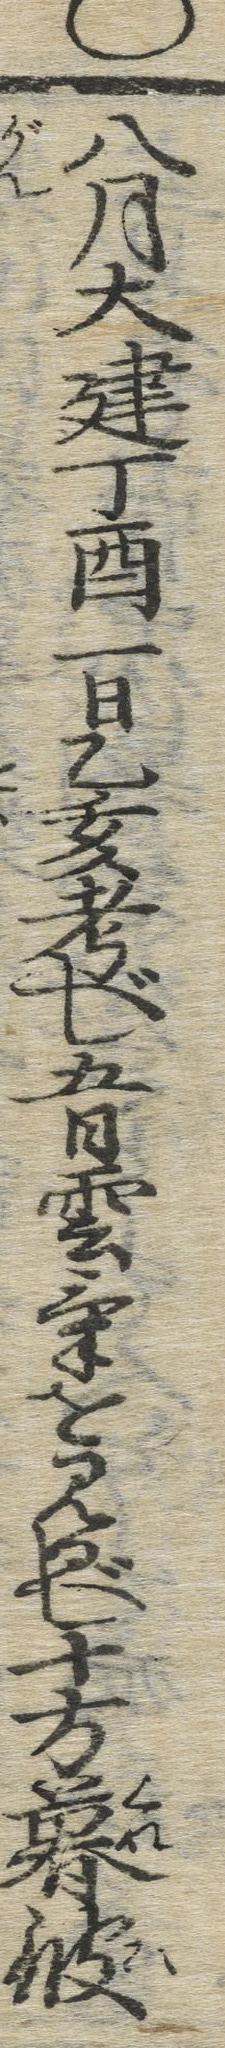八月大建丁酉一日乙亥考べし五日雲気を見るべし十方暮彼
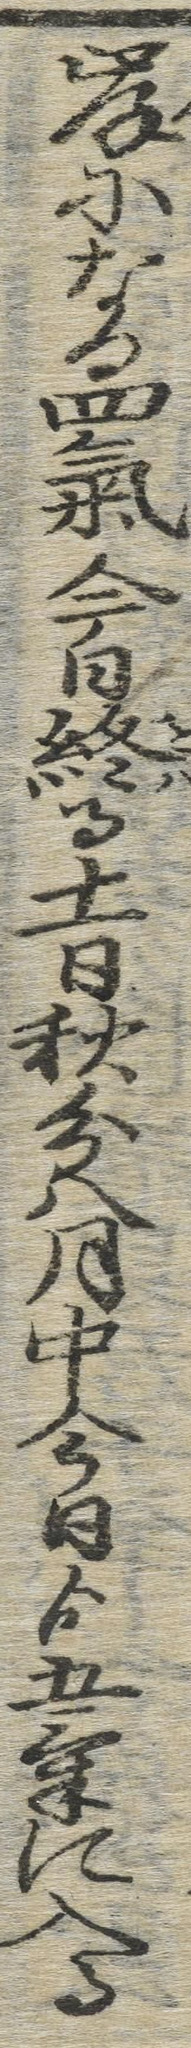岸になる四気今日終る十一日秋分八月中今日ゟ五気に入る
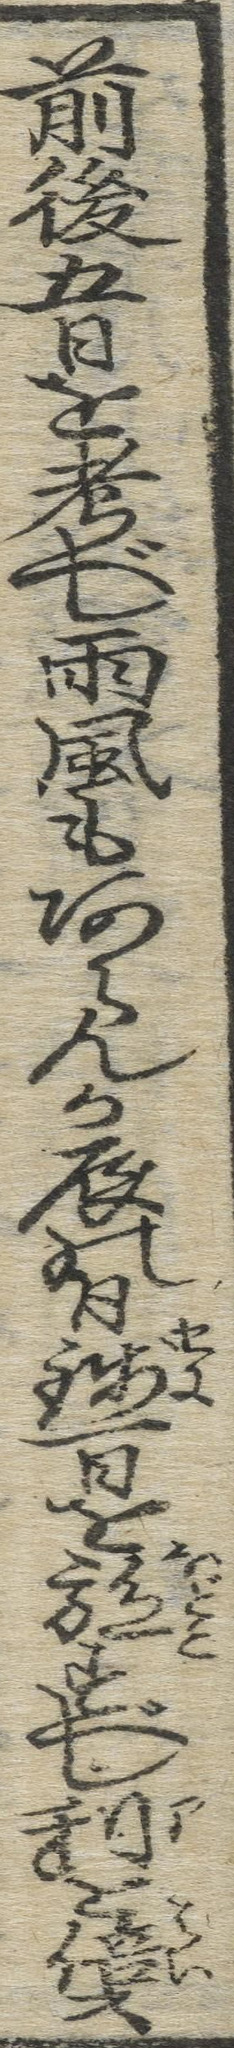前後五日を考べし雨風もあらんか辰の日銭一日を施すべし利を倍す
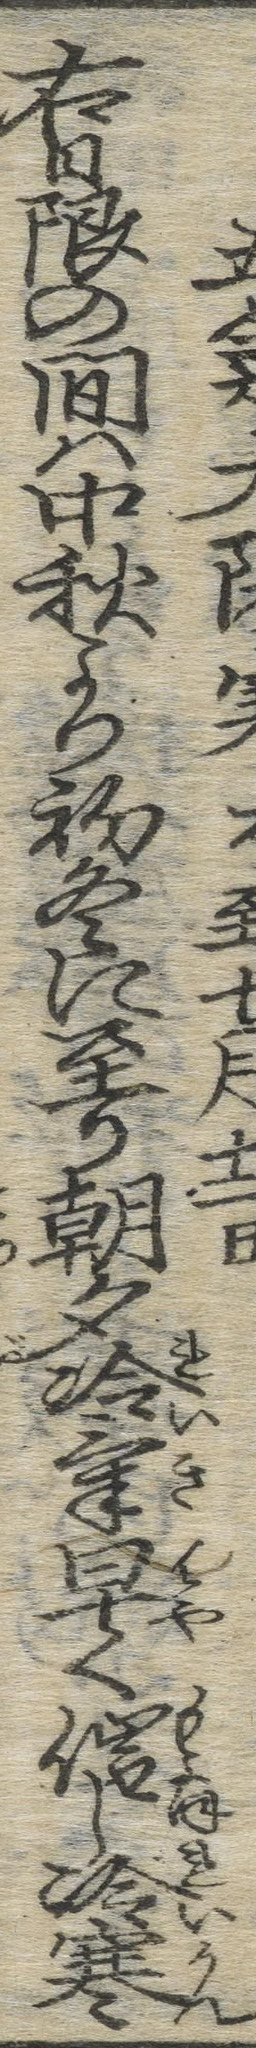右日限の間は中秋より初冬に至り朝夕冷気早く催し冷寒
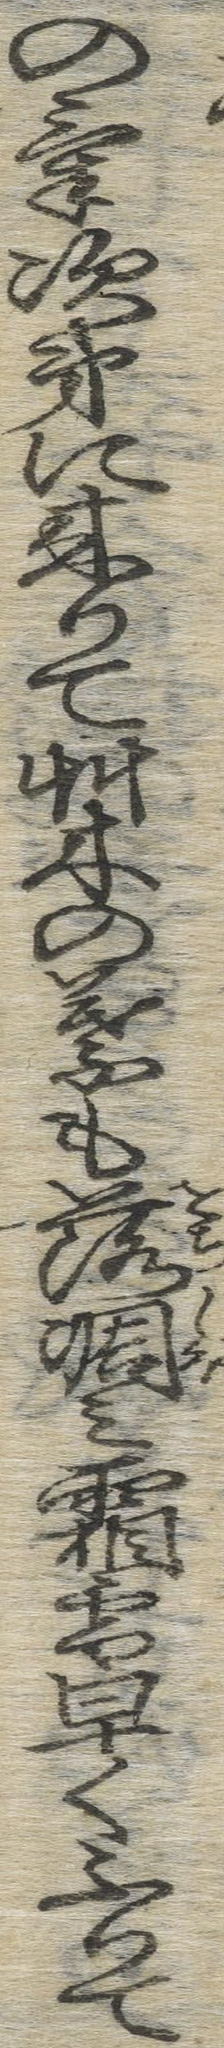の気次第に来りて艸木の葉も落凋み霜雪早くふりて
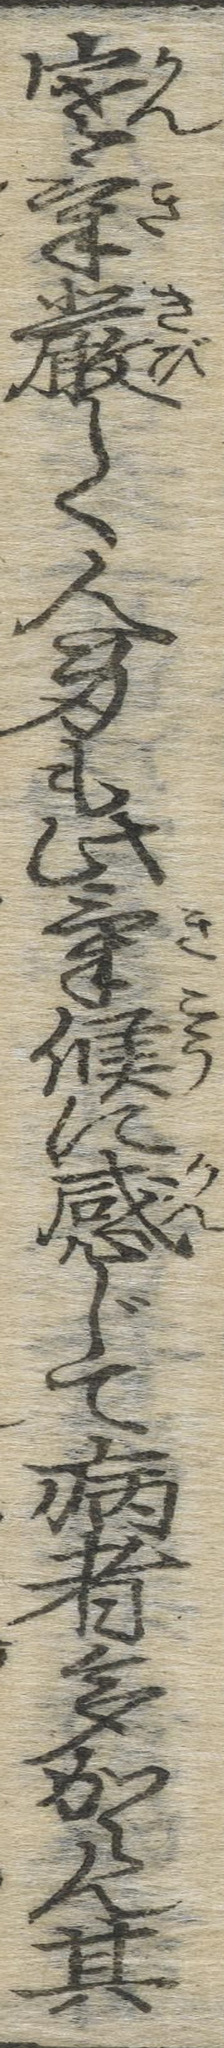寒気厳しく人身も此気候に感じて病者多からん其
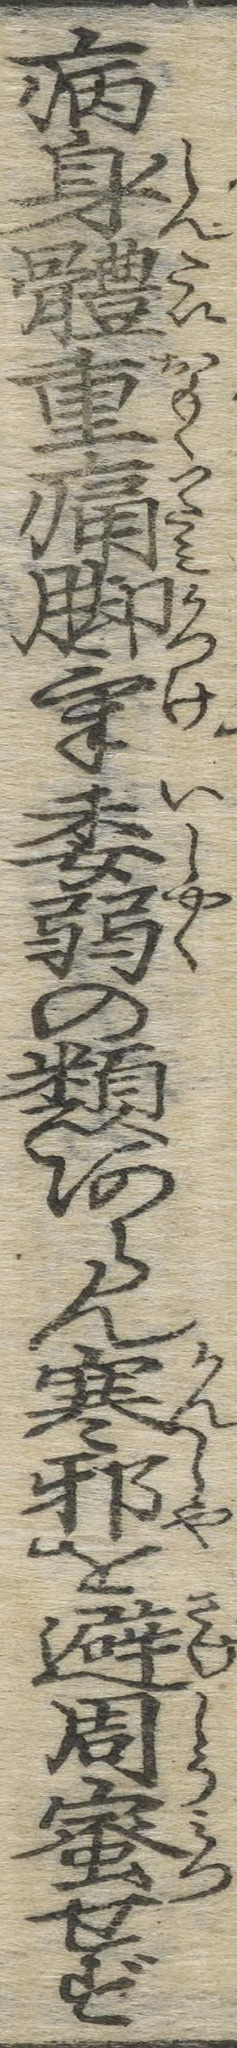病身体重痛脚気委弱の類あらん寒邪を避周蜜せず
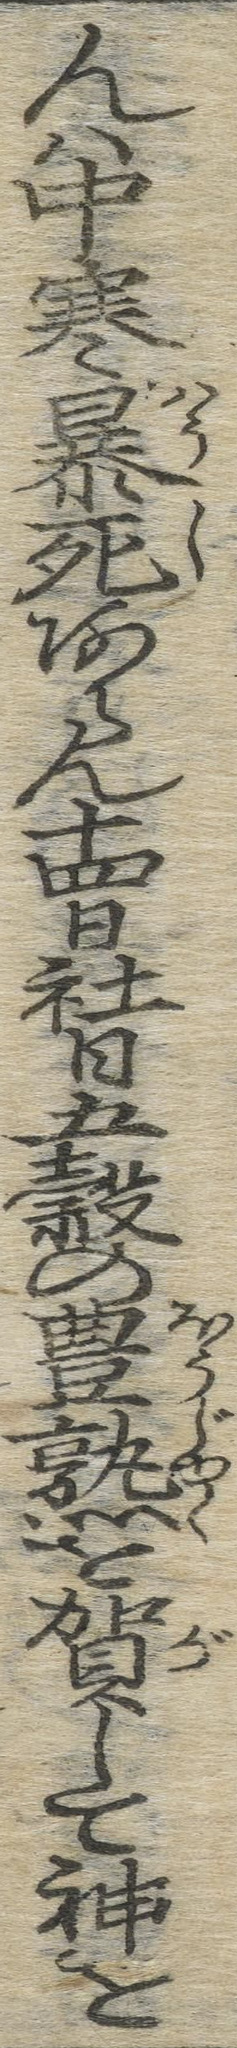んは中寒暴死あらん十四日社日五穀の豊熟を賀して神を
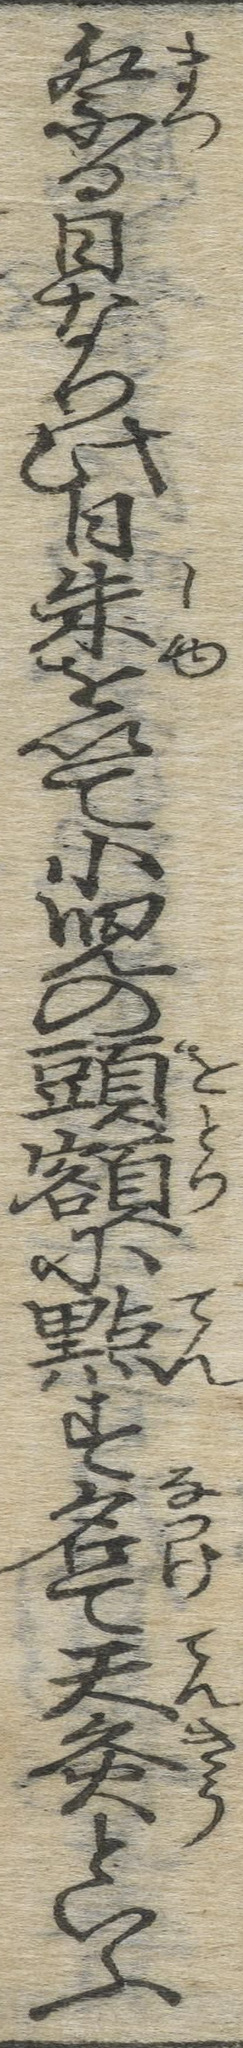祭る日なり此日朱を以て小児の頭額に点す名て天灸といふ
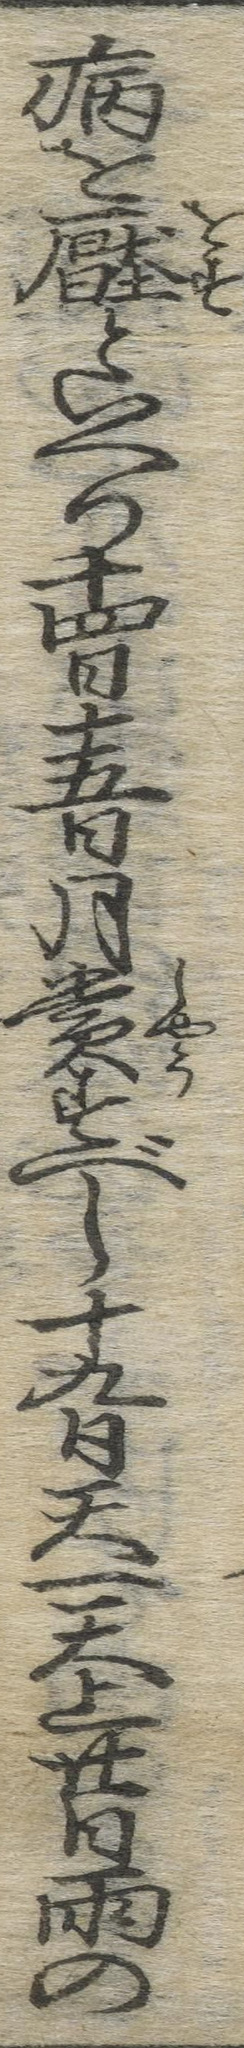病を壓といへり十四日十五日月賞すべし十九日天一天上廿日雨の
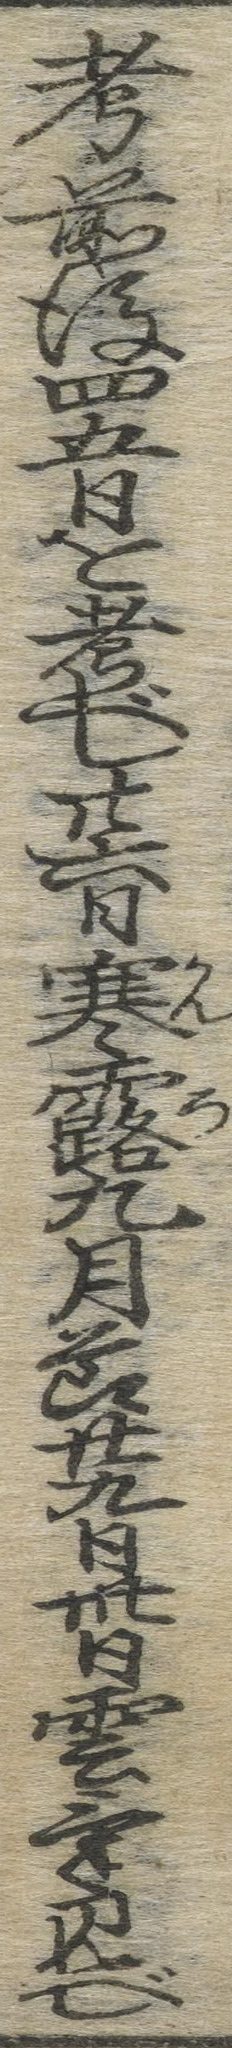考前後四五日を考べし廿六日寒露九月節廿九日卅日雲気見べし

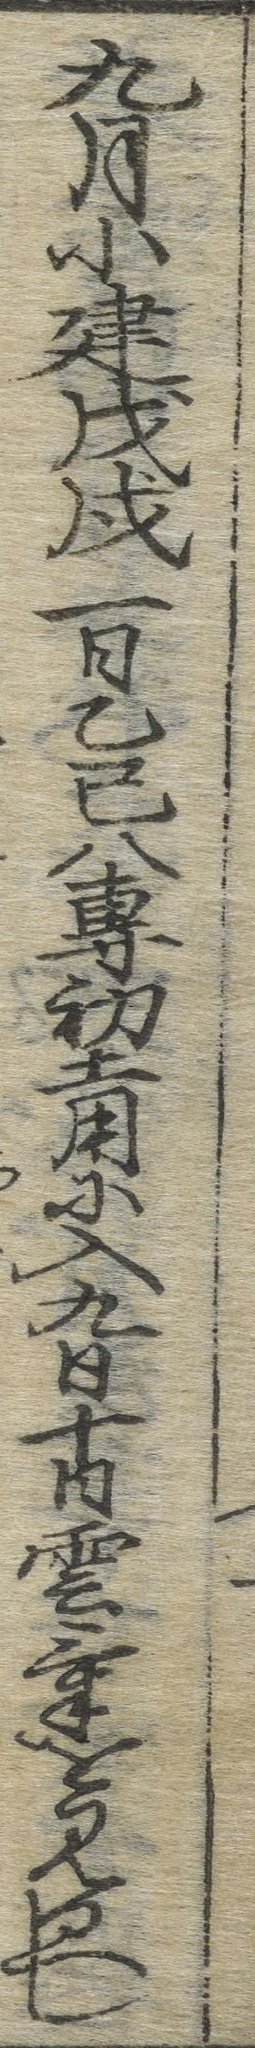九月小建戊戌一日乙巳八専初土用に入九日十日雲気を見るへし
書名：[晴雨考]
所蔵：東京大学地震研究所図書室 Earthquake Research Institute Library, The University of Tokyo, JAPAN
